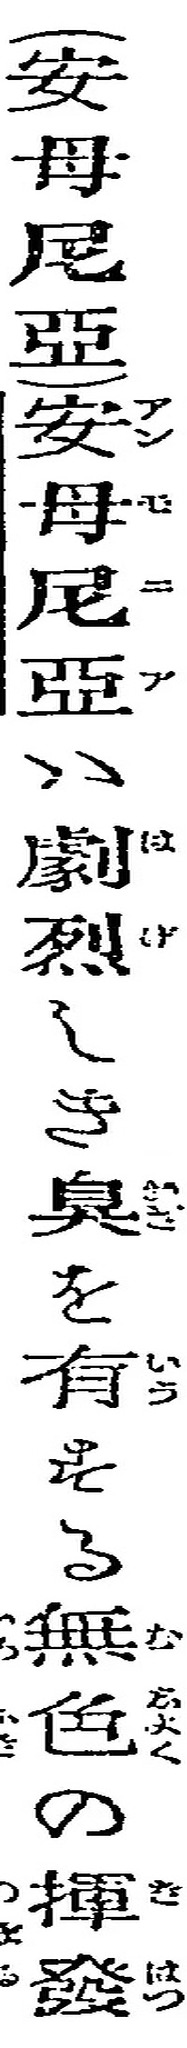[安母尼亞]安母尼亞は激烈しき臭を有する無色の揮發
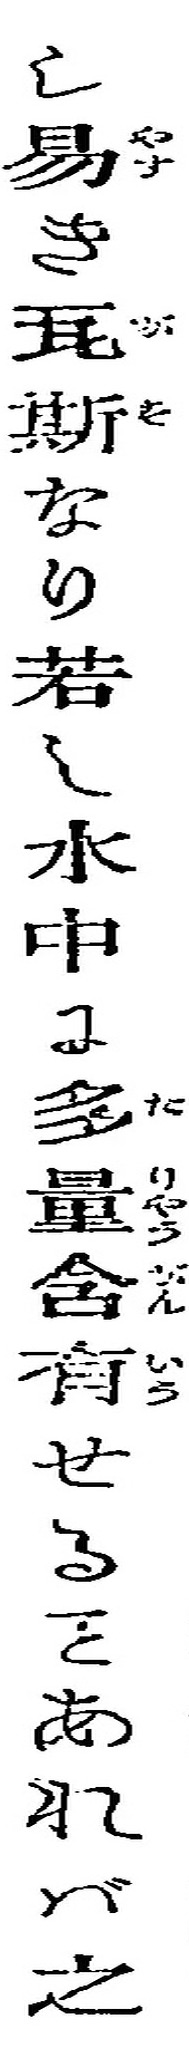し易き瓦斯なり若し水中に多量含有せることあれば之
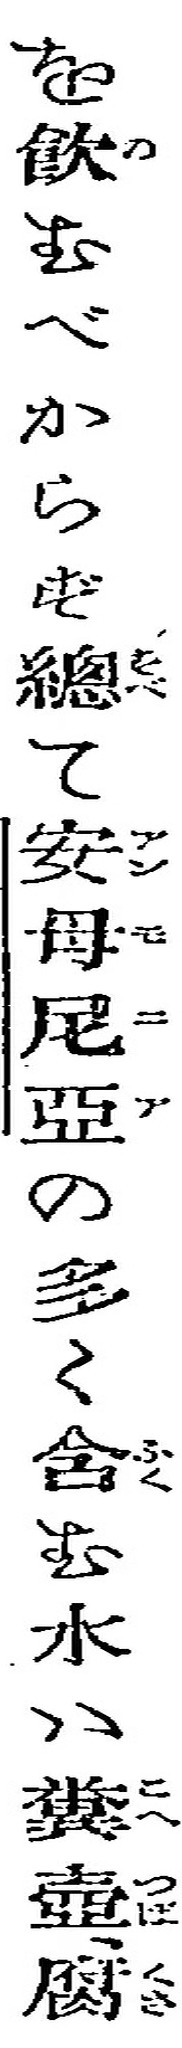を飲むべからず総て安母尼亞の多く含む水は糞壺、腐
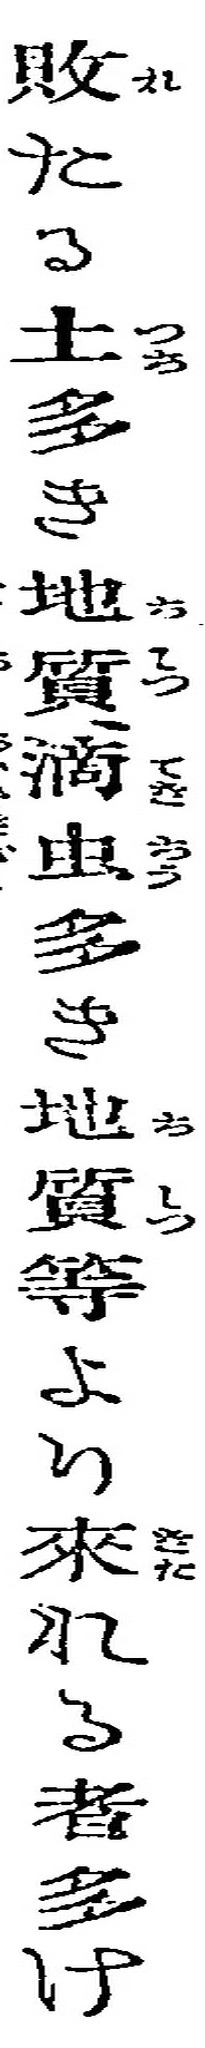敗たる土多き地質、滴虫多き地質等より來れる者多け
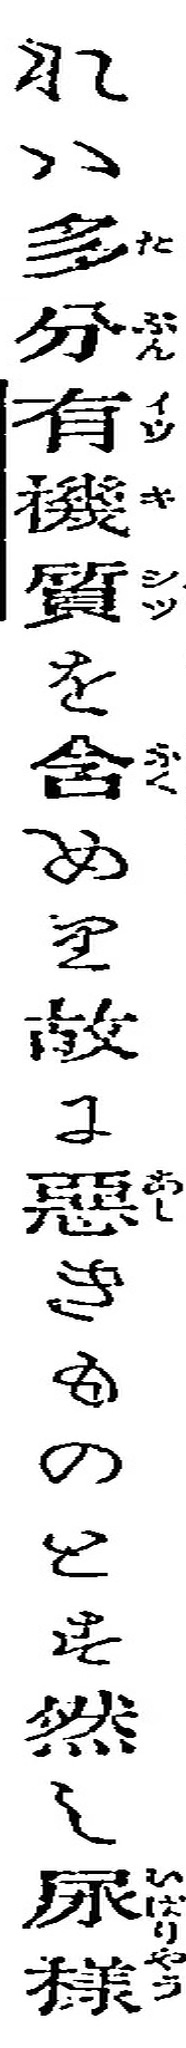れは多分有機質を含めり故に惡きものとす然し尿様
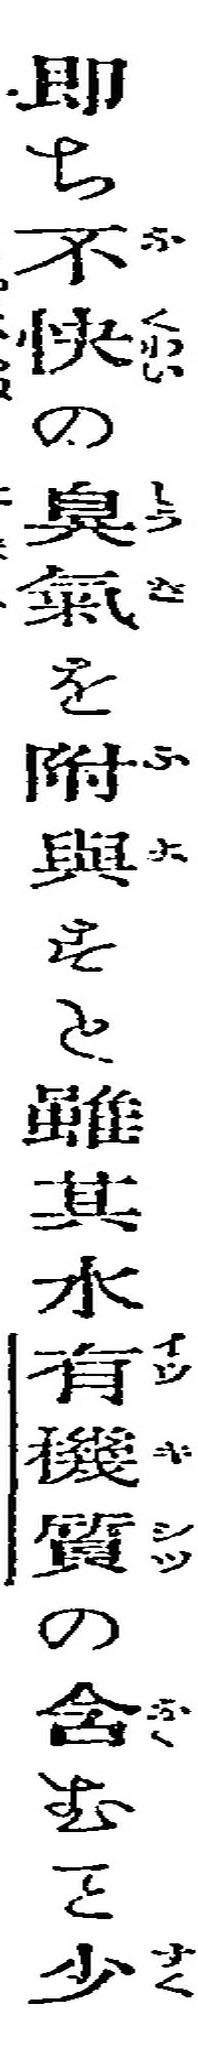即ち不快の臭気を附與すと雖其水有機質の含むこと少
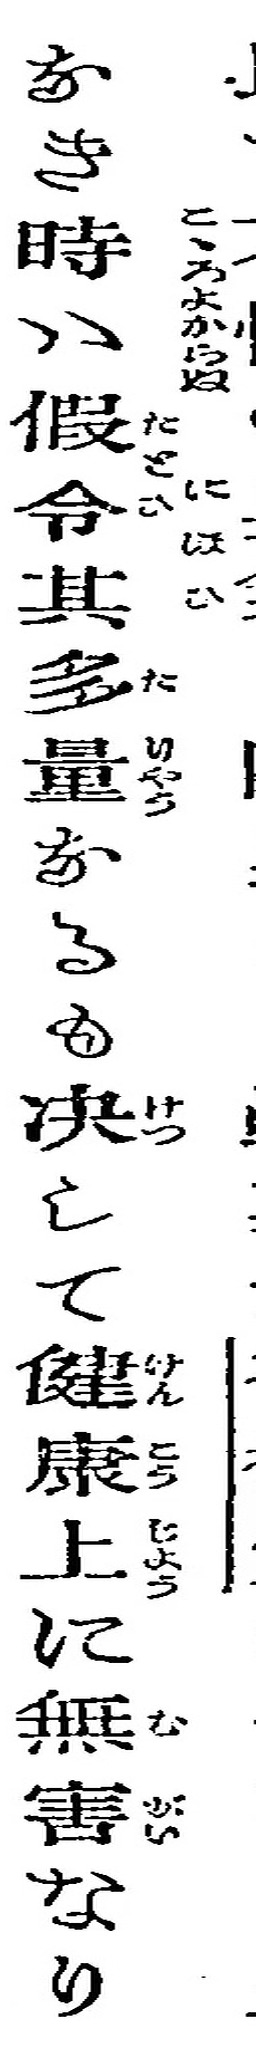なき時は假令其多量なるも決して健康上に無害なり
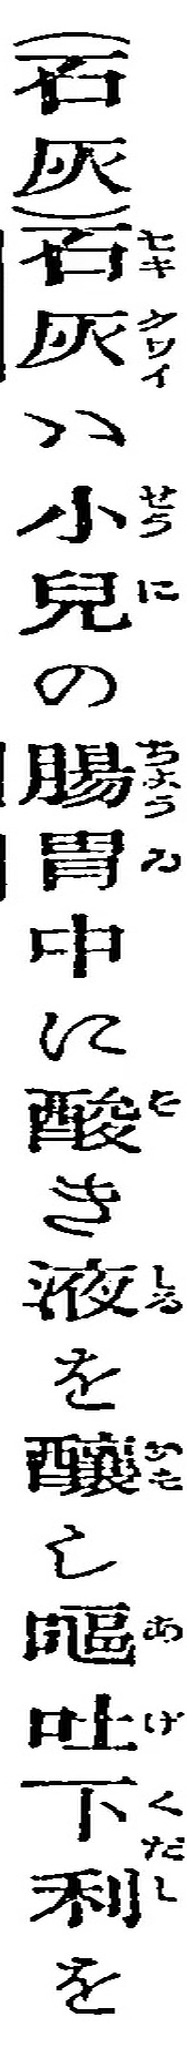[石灰]石灰は小兒の膓、胃中に酸き液を醸し嘔吐下利を
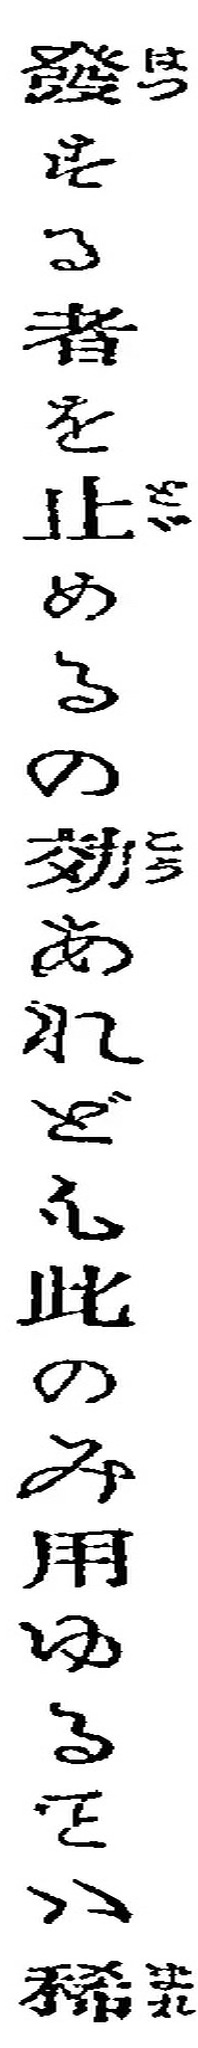發する者を止めるの効あれども此のみ用ゆることは稀
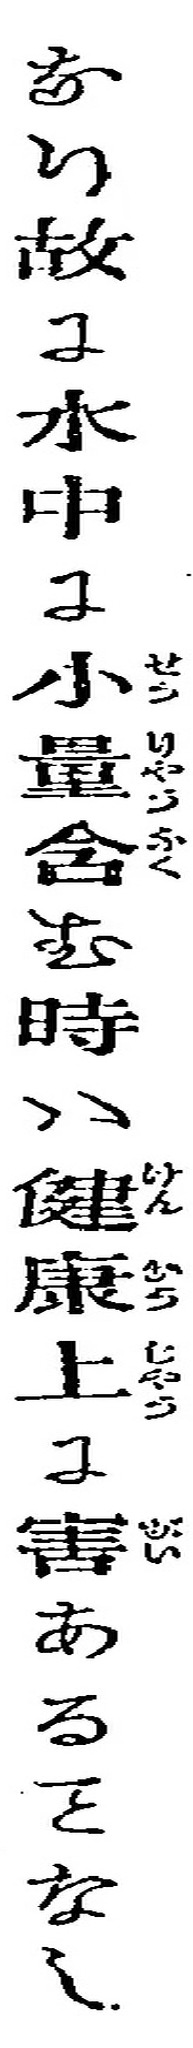なり故に水中に小量含む時は健康上に害あることなし
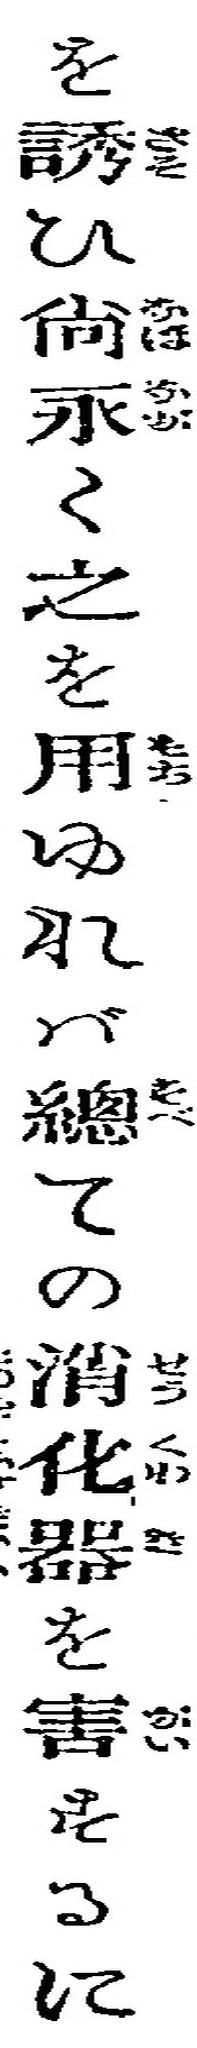を誘ひ尚永く之を用ゆれば総ての消化器を害するに
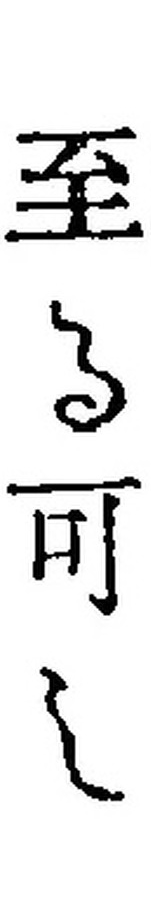至る可し
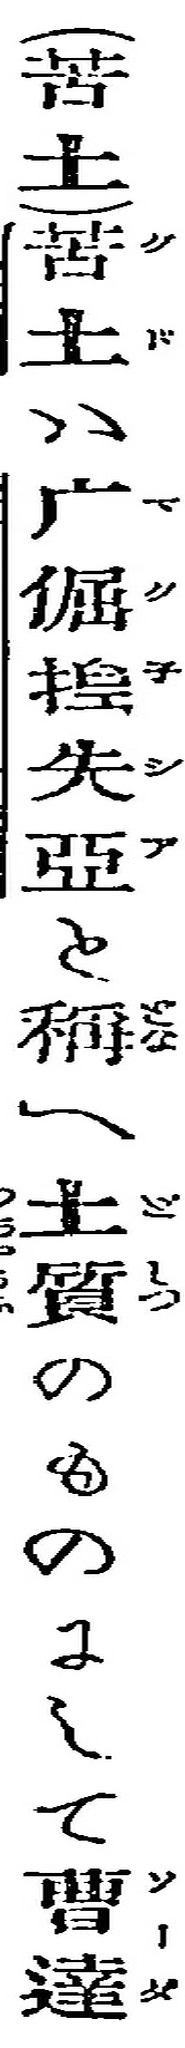[苦土]苦土は广倔揑失亞と稱へ土質のものにして曹達
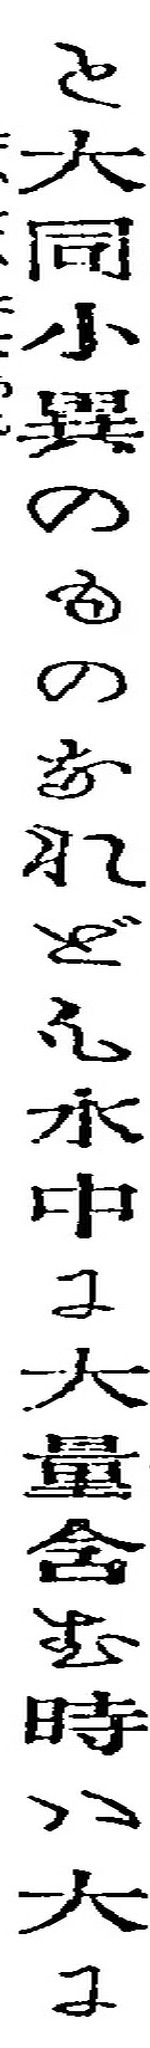と大同小異のものなれども水中に大量含む時は大に
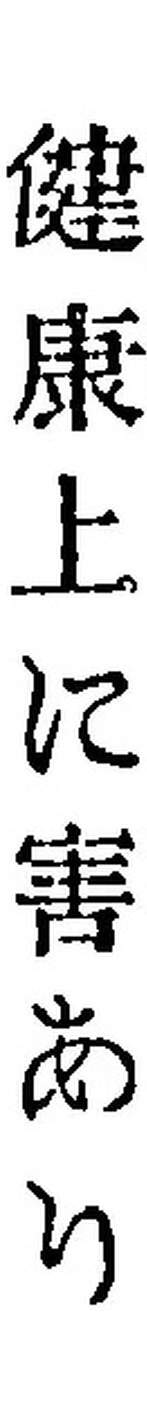健康上上に害あり
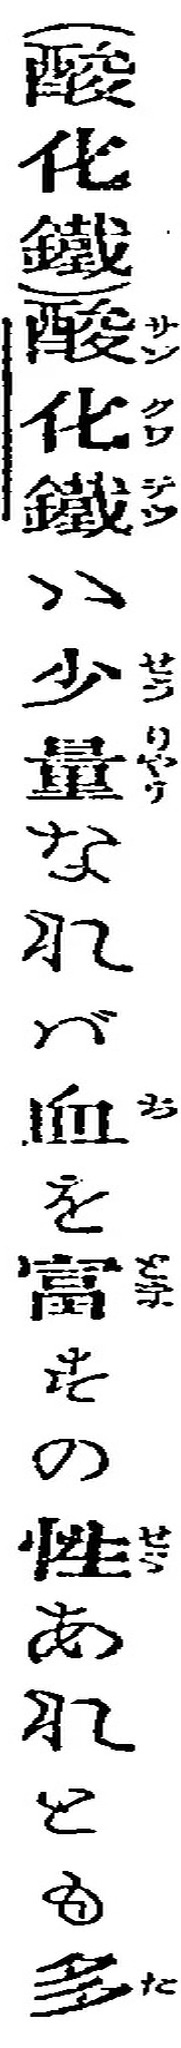[酸化鐵]酸化鐵は少量なれば血を富すの性あれとも多
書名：飲水の心得 : 伝染病の予防
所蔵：国立国会図書館 National Diet Library, JAPAN
